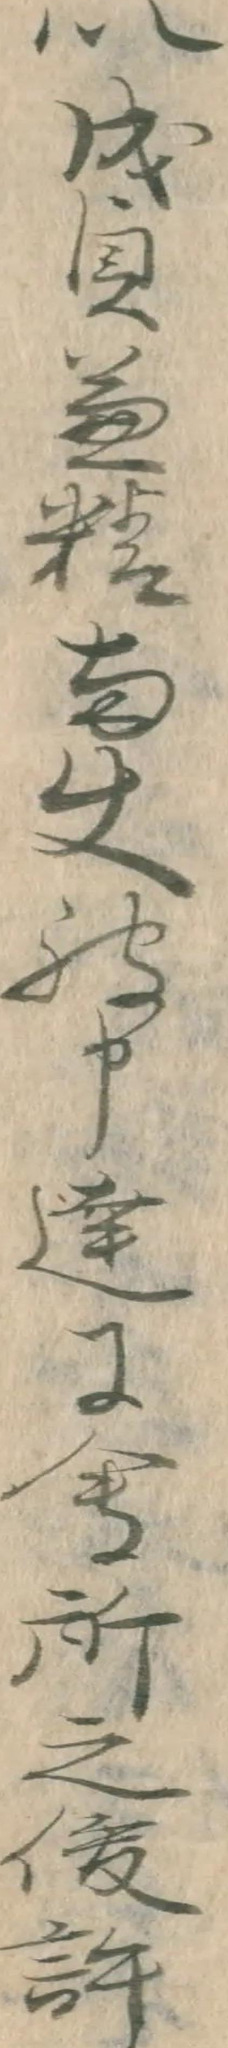以成貞兼精両使被申達に会所之俊許
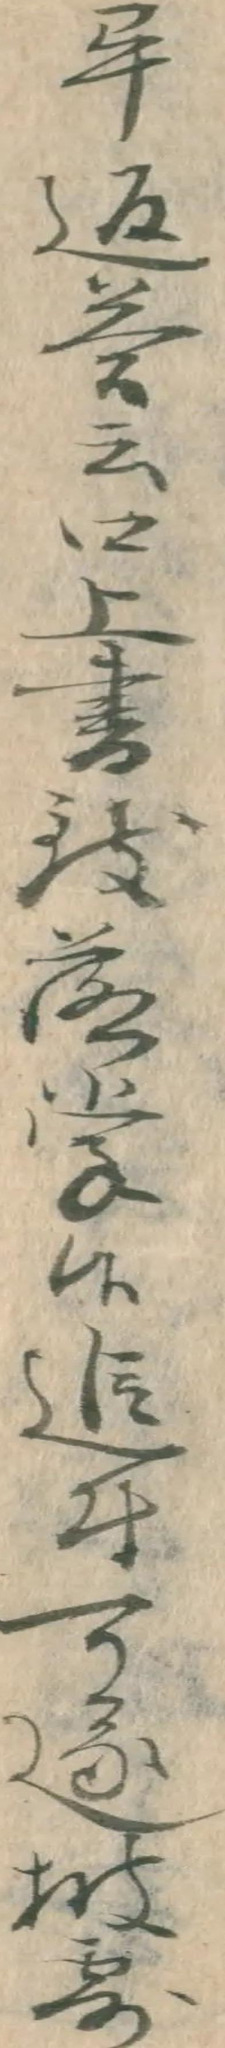畢返答云口上書致落掌候追付可遂披露
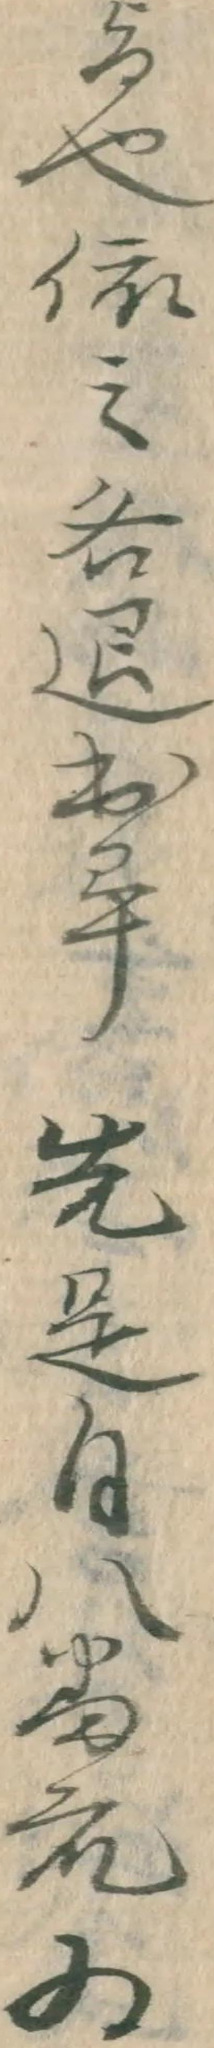旨也依之各退出畢先是自八番衆為
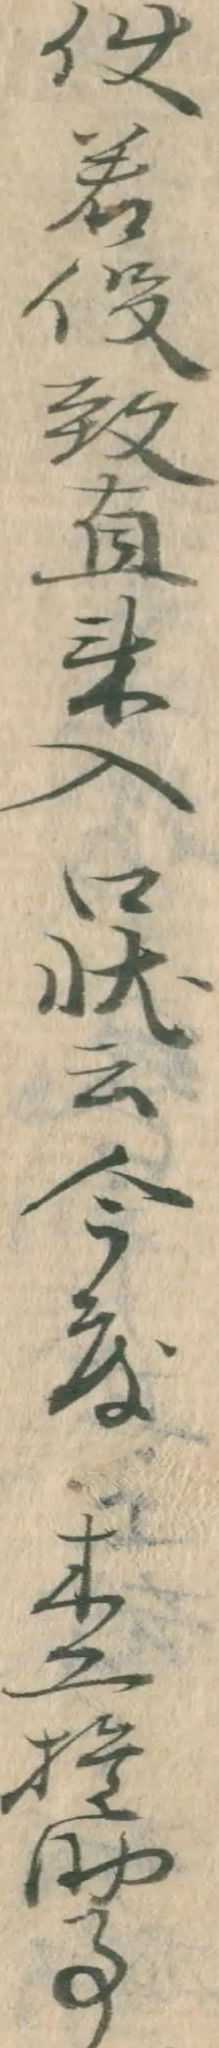使若役致直来入口状云今度木工権助事
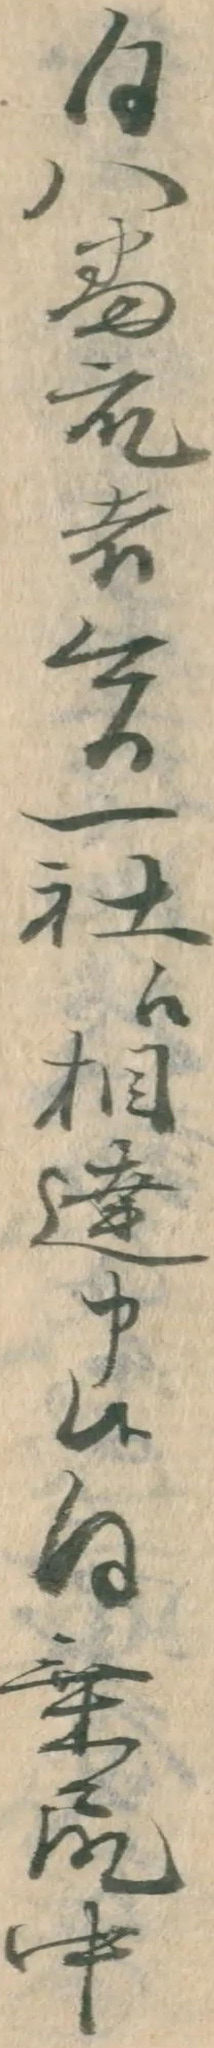自八番衆者今日一社江相達申候自乗尻中
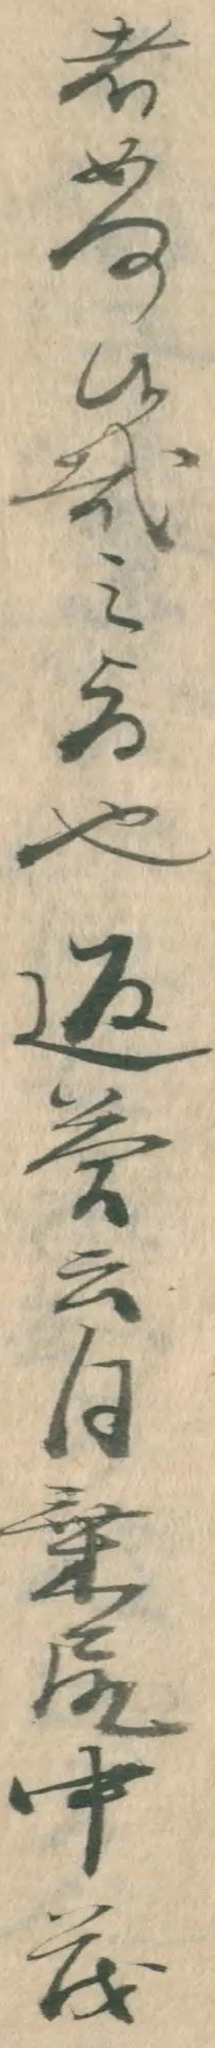者如何候哉之旨也返答云自乗尻中茂
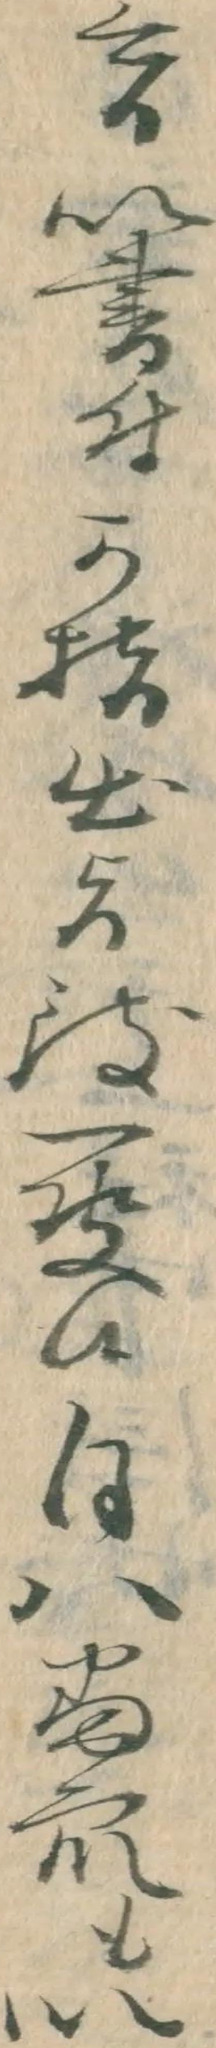今日以書付可指出旨致一決候自八番衆も以
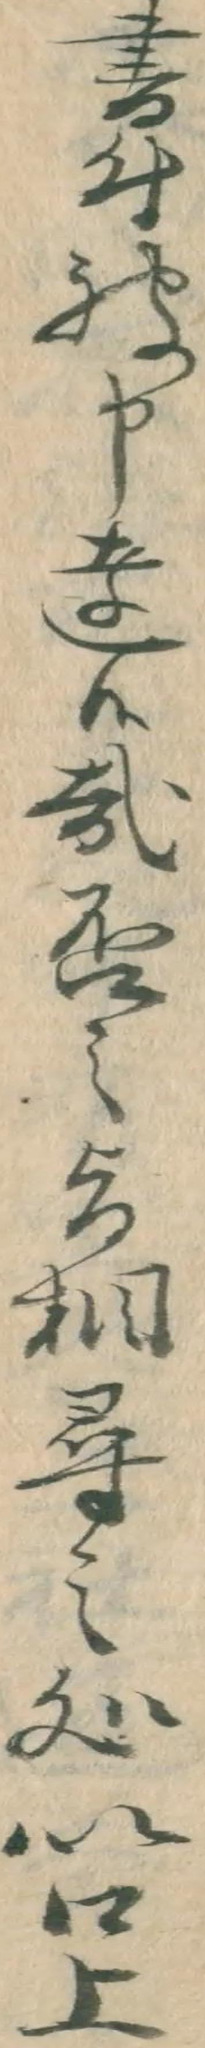書付被申達候哉否之旨相尋之処以口上

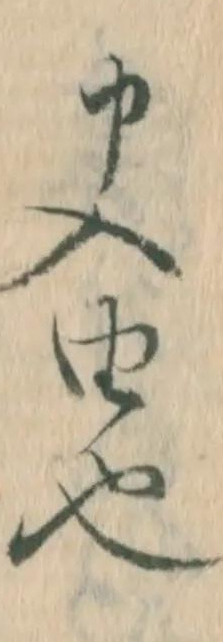申入由也
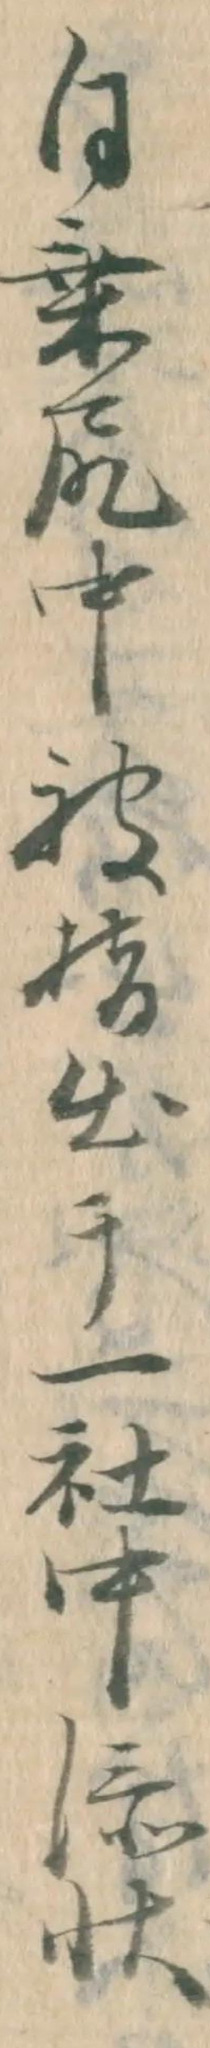自乗尻中被指出于一社中添状
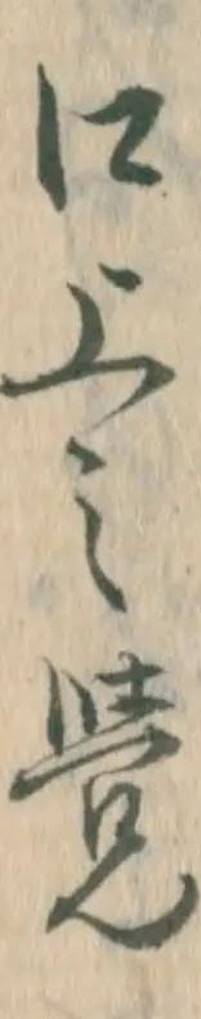口上之覚
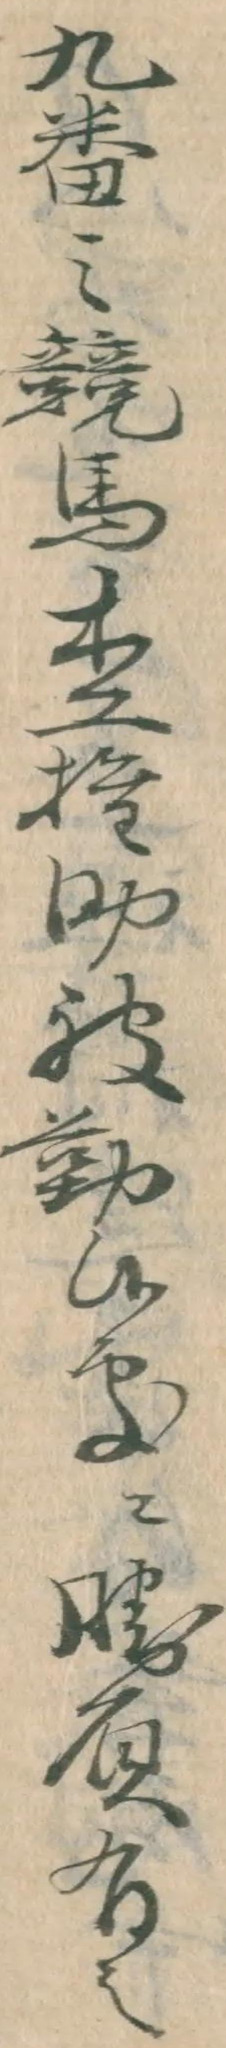九番之競馬木工権助被勤候処二勝負有之
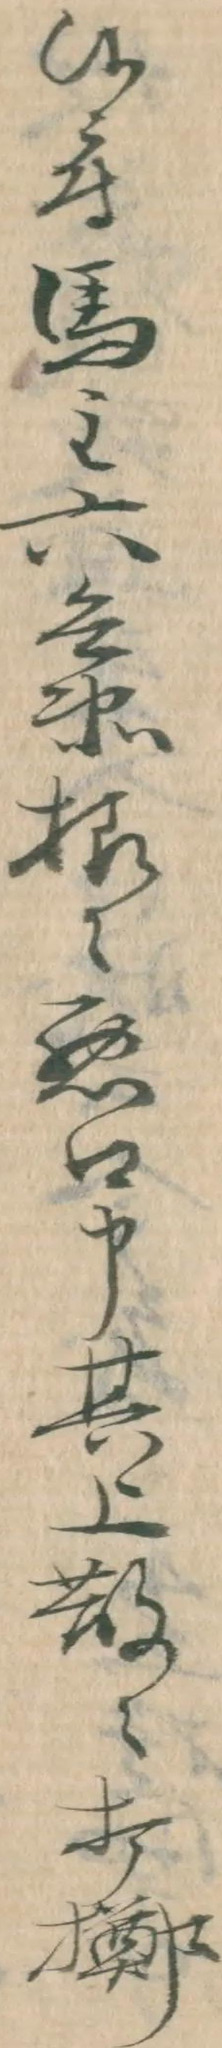候ニ付馬主六兵衛様之悪口申其上散々打擲
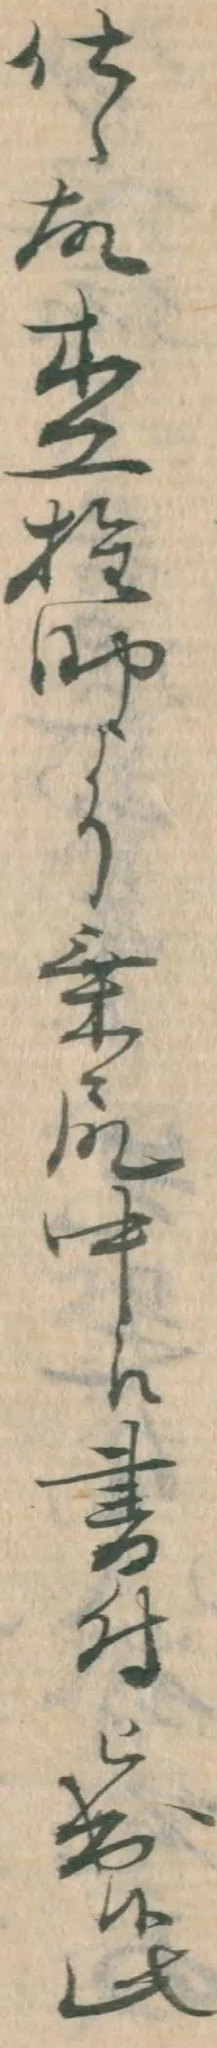仕候故木工権助より乗尻中江書付被出候此
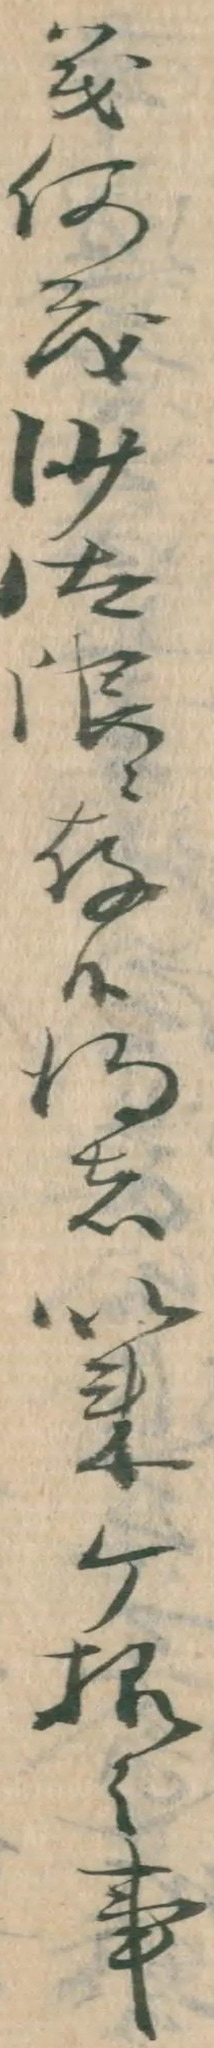義何茂沙汰限ニ存候得者以来ケ様之事
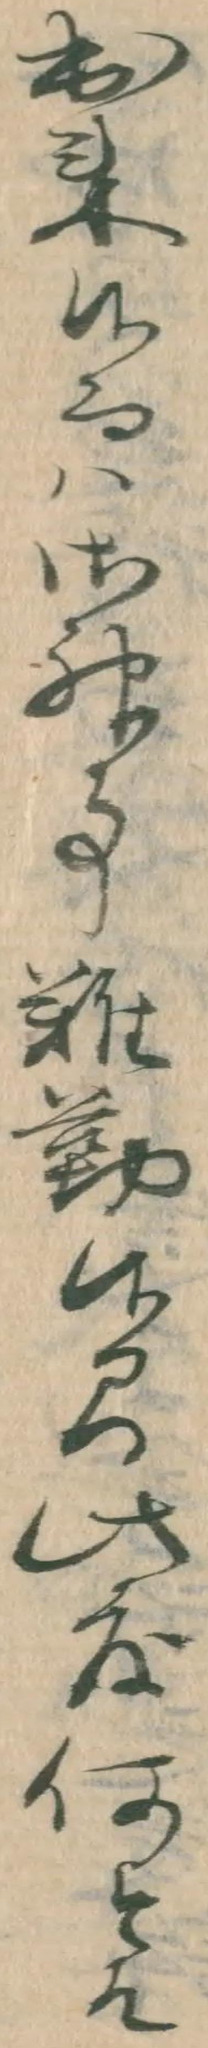出来候而ハ御神事難勤候間此度何と歟
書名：賀茂社記録. 第10冊
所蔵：国立国会図書館 National Diet Library, JAPAN
